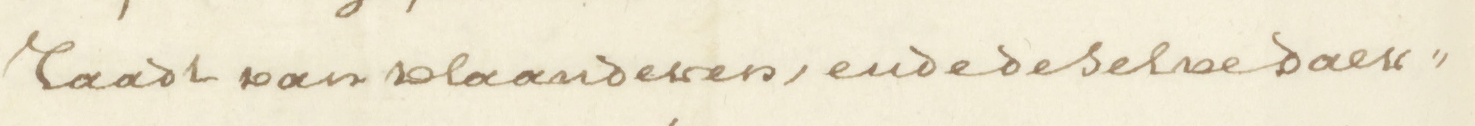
Raadt van Vlaanderen, ende deselve daer,
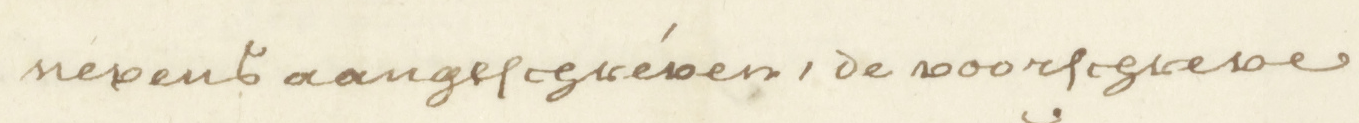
nevens aangeschreven, de voorschreve
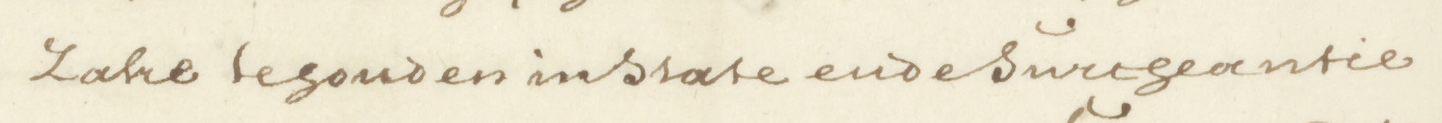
zake te houden in state ende surcheantie
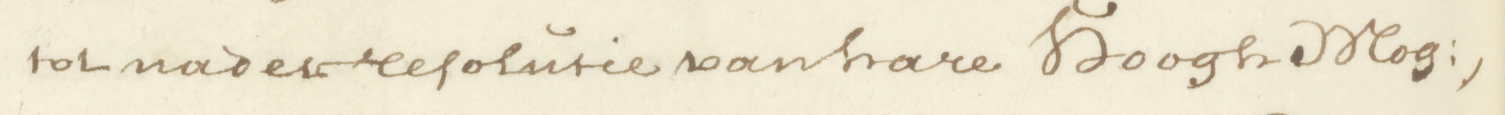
tot nader resolutie van hare Hoogh Mog:,
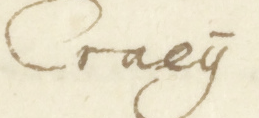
Craeij
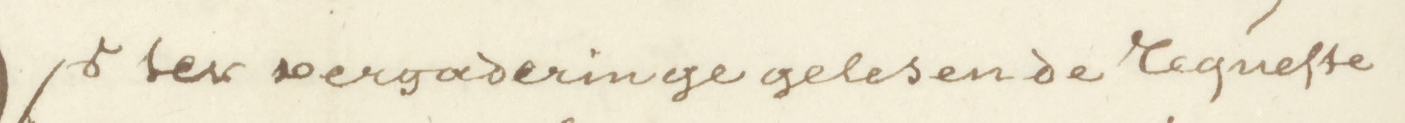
Is ter vergaderinge gelesen de requeste
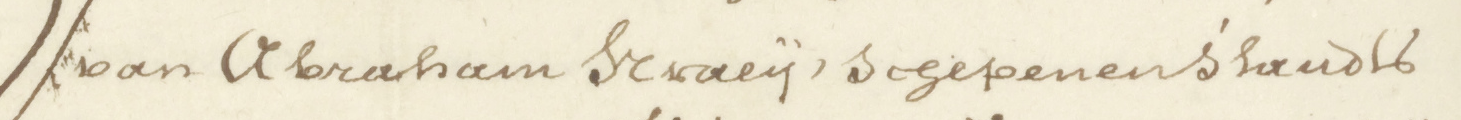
van Abraham Kraeij, schepenen s'landts
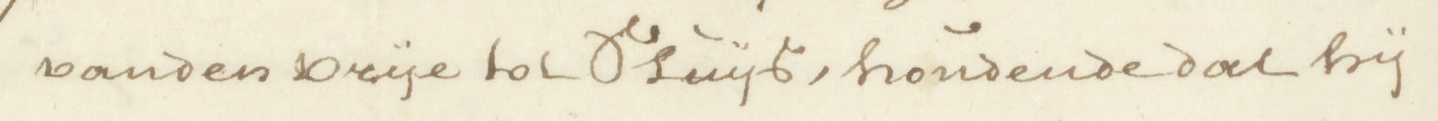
vanden vrije tot Sluijs, houdende dat hij
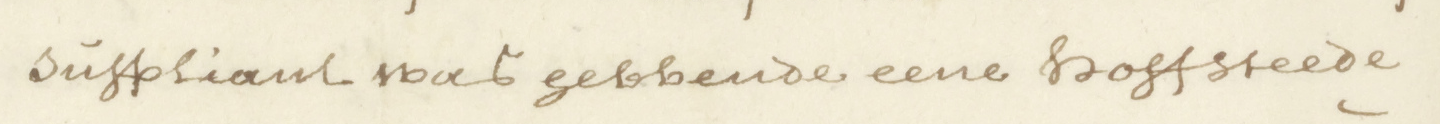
suppliant was hebbende eene Hoffsteede
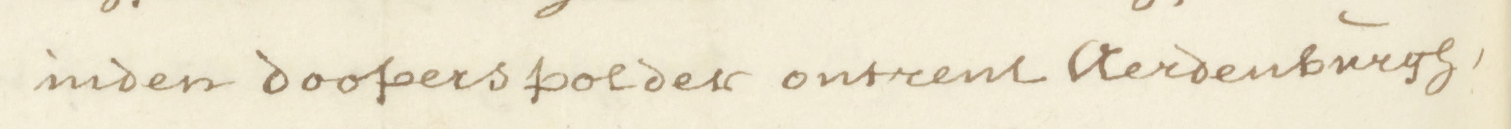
inden dooperspolder ontrent Aerdenburgh,
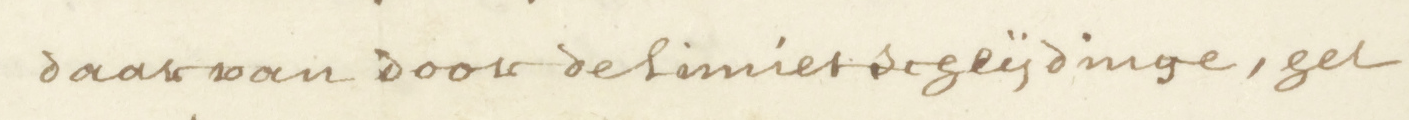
daar van door de limietscheijdinge, het
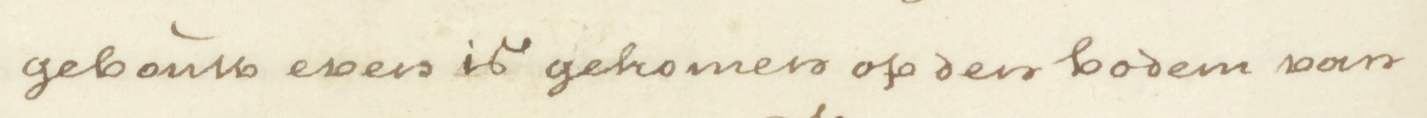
gebouw even is gekomen op den bodem van
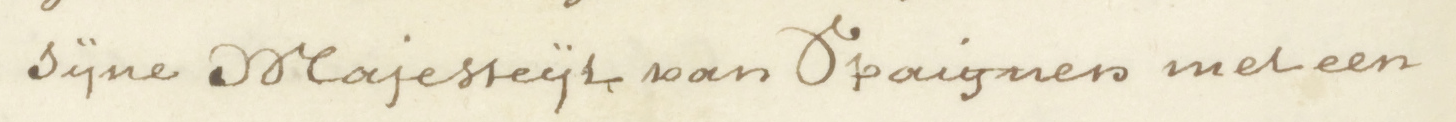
sijne Majesteijt van Spaignen met een
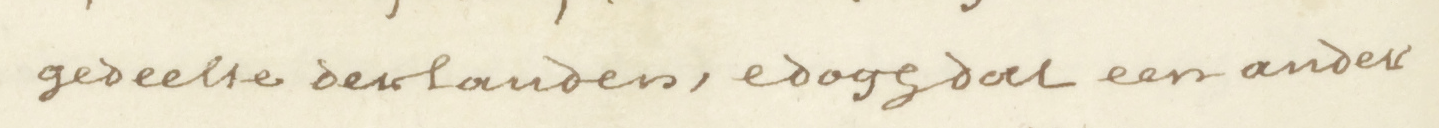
gedeelte der landen, edogh dat een ander
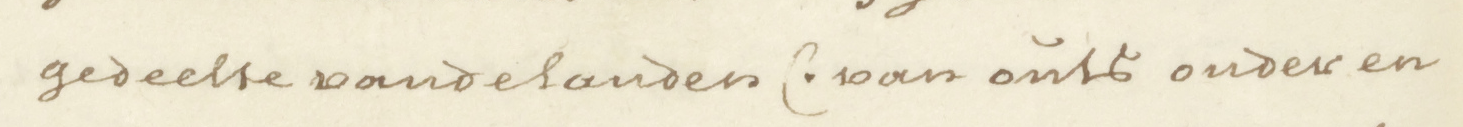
gedeelte vande landen (. van outs onder en
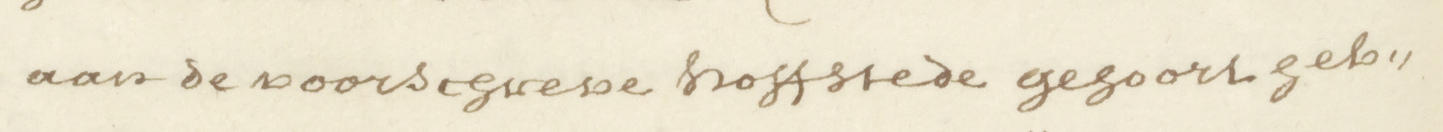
aan de voorschreve hoffstede gehoort heb„
